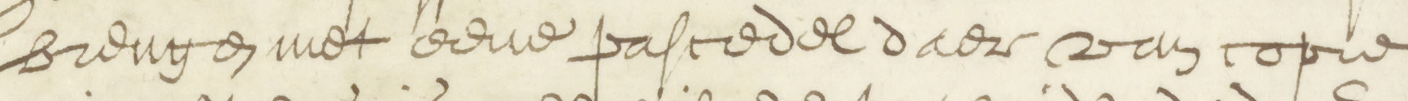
brengen met eene pascedel daer van copie
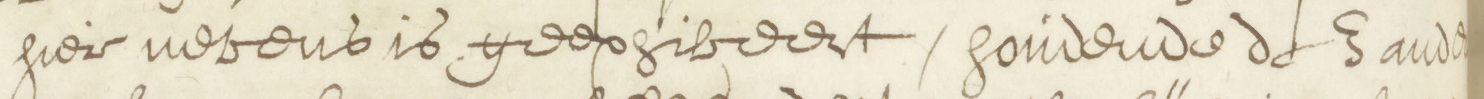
hier nevens is geexhibeert, houdende den ande
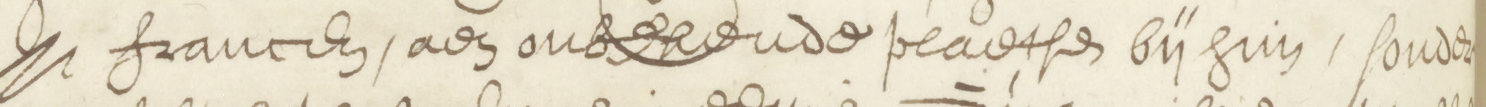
N francen, aen onbekende plaetsen bij hun, sonder
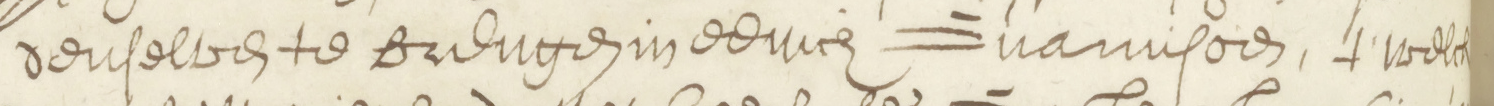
denselven te brengen in eenich Guarnisoen, t‛ welck
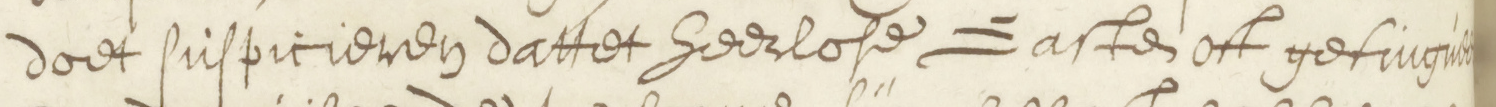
doet suspicieren dattet heerlose Gasten off gefingue
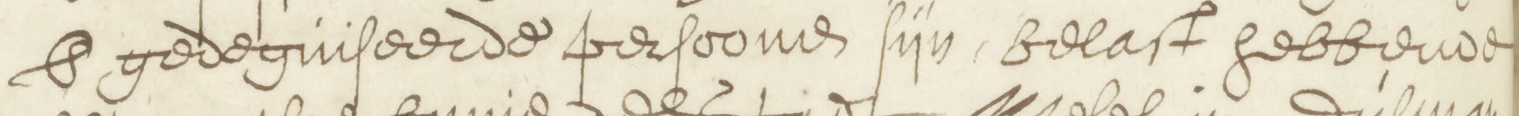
& gedeguiseerde persoonen sijn, belast hebbende
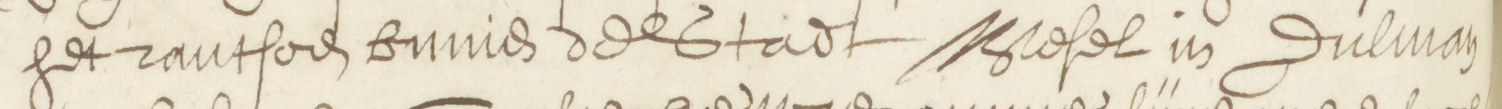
het rantsoen binnen de Stadt Wesel in Dulman
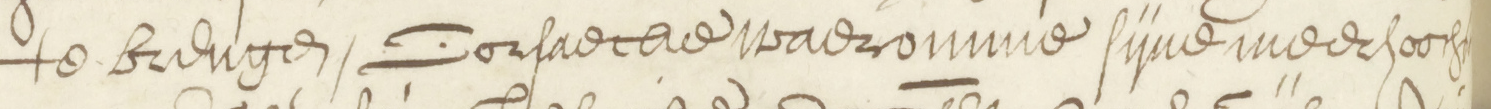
te brengen. Oorsaecke waeromme sijne meerhooch
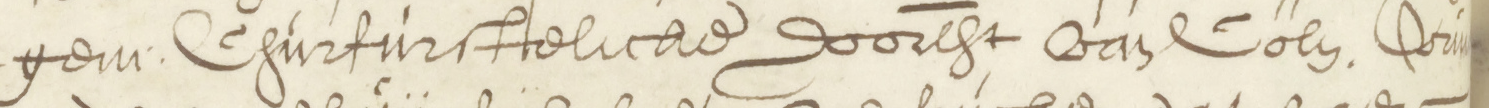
gem. Churfurstelicke Doorlht. van Cöln vru
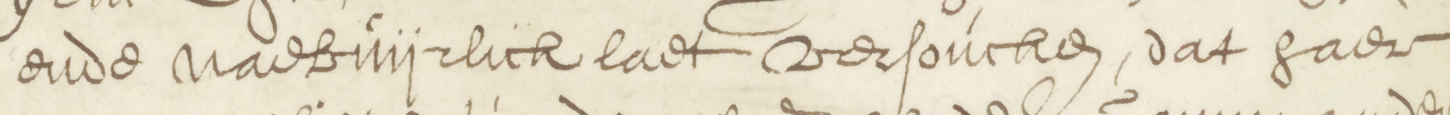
ende naebuijrlick laet versoucken, dat haer
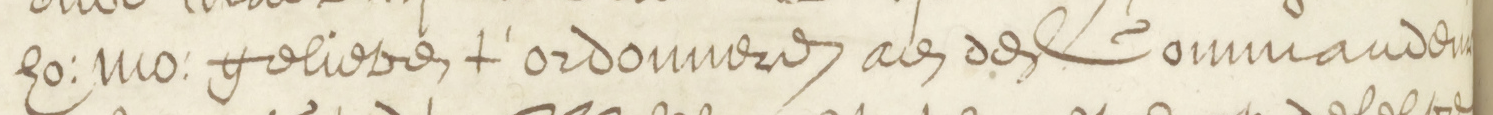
ho:Mo: gelieven t‛ordonneren aen den Commandeur
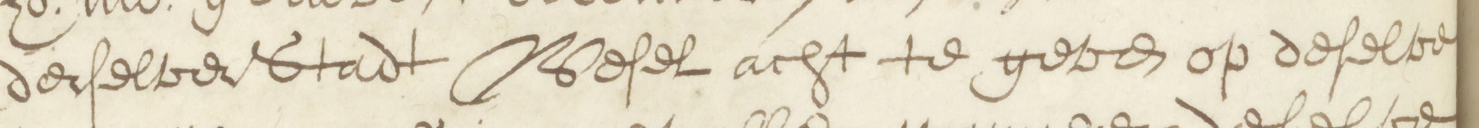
derselver Stadt Wesel acht te geven op deselve
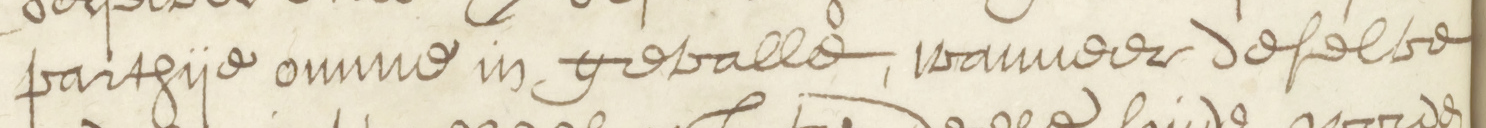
parthije omme in gevalle, wanneer deselve
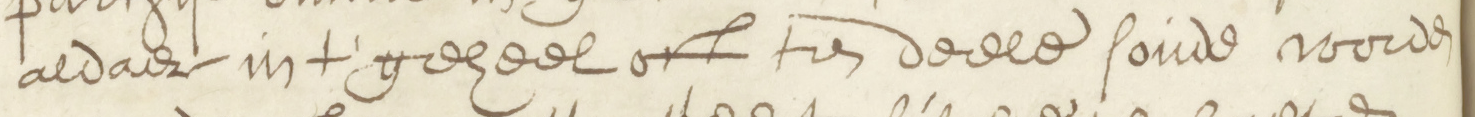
aldaer in t‛ geheel off ten deele soude worden
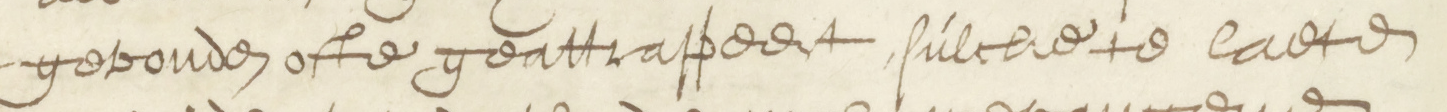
gevonden ofte geattrappeert, sulcke te laeten
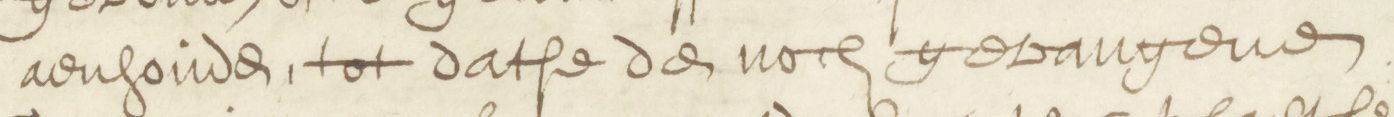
aenhouden, tot datse den noch gevangenen
